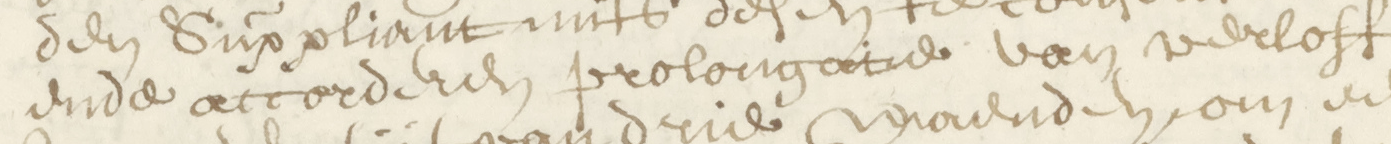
ende accorderen prolongatie van verloff
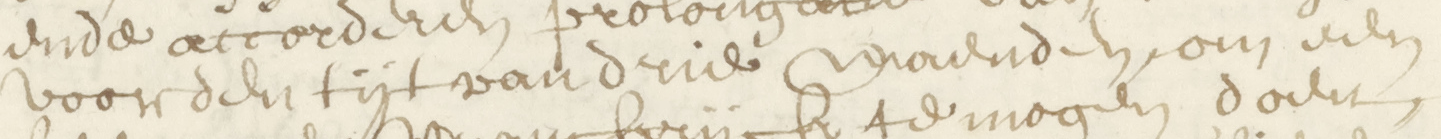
voor den tijt van drie maenden, om een
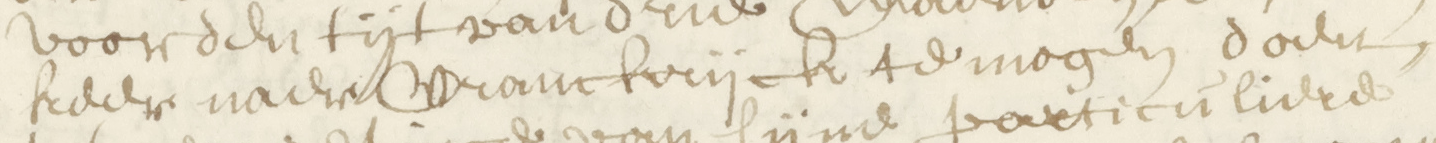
keer naer Vranckrijck te mogen doen,
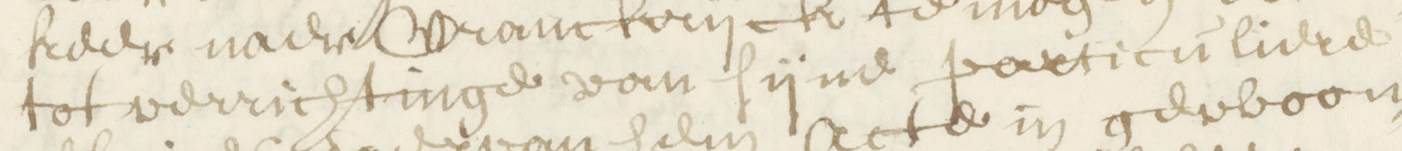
tot verrichtinge van sijne particuliere
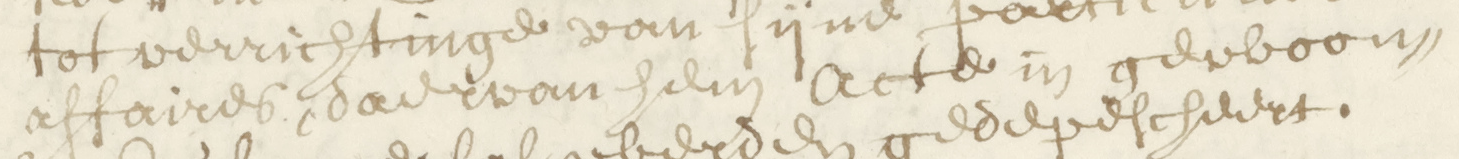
affaires, daervan hem acte in gewoon„
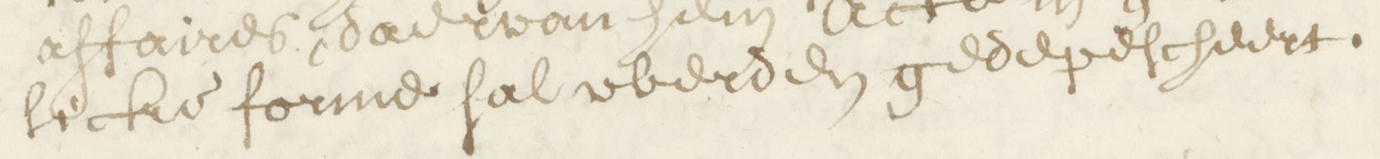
licke forme sal werden gedepescheert.
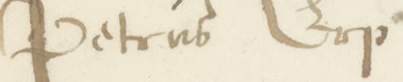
Petrus Erp.
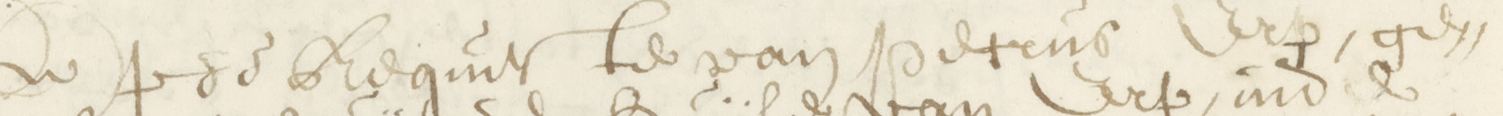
Op de Requeste van Petrus Erp, ge„
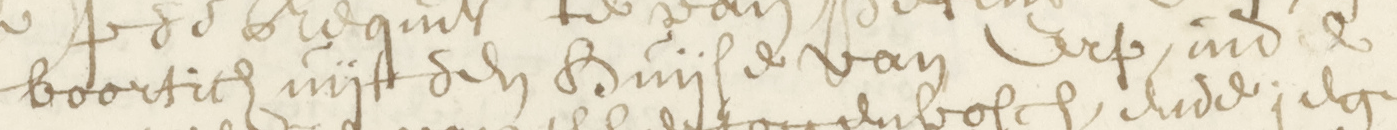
boortich uijt den Huijse van Erp, inde
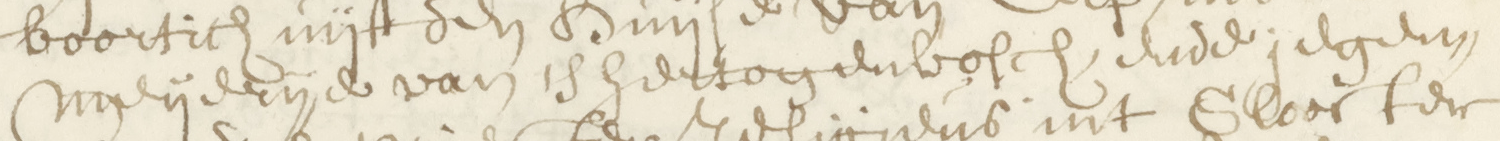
Meijerije van 's Hertogenbosch, ende jegen,,
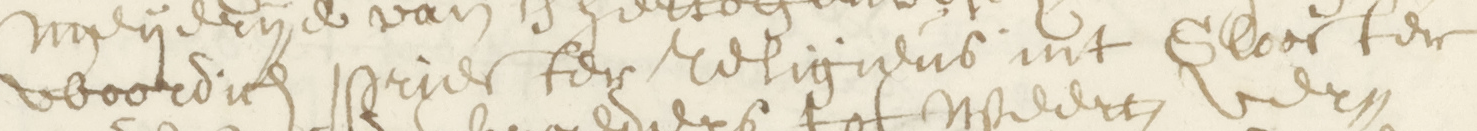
woordich priester religieus int Clooster
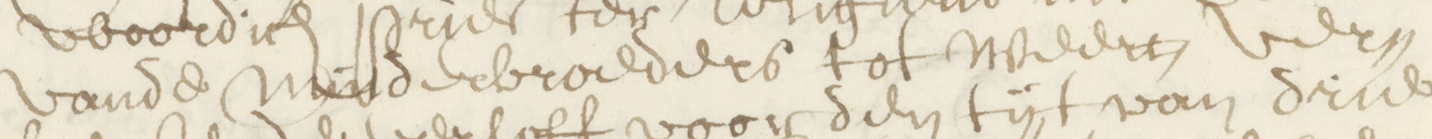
vande Minderbroeders tot Weert, ver„
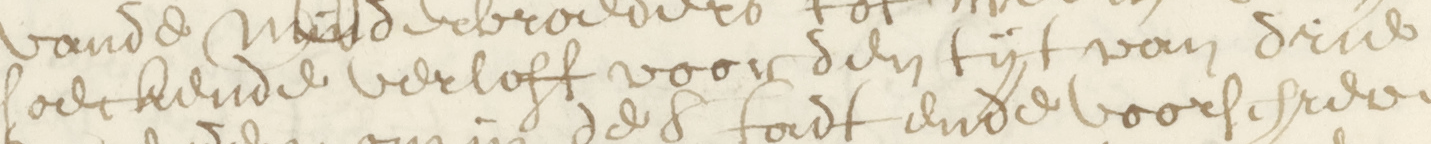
soeckende verloff voor den tijt van drie
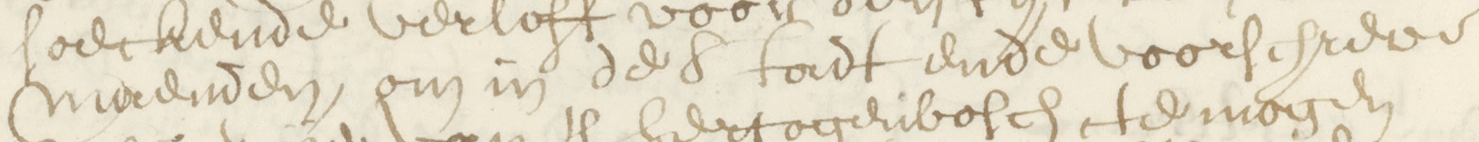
maenden, om in de Stadt ende voorschreve
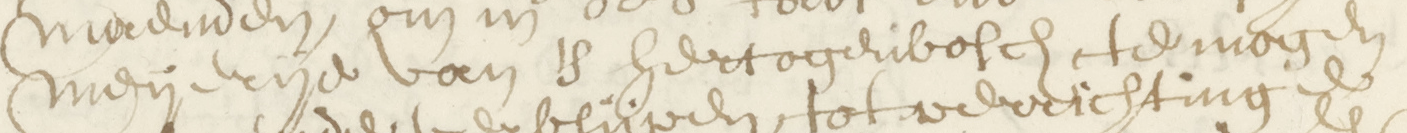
Meijerije van 's Hertogenbosch, te mogen
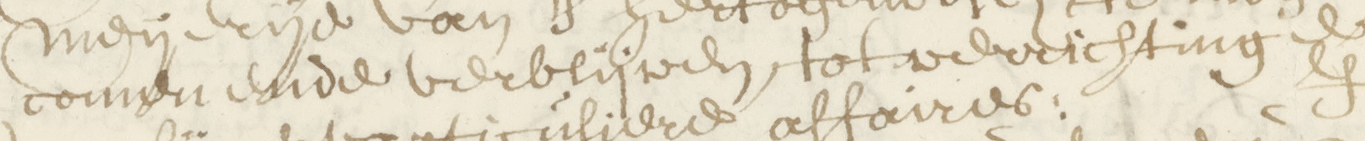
comen ende verblijven, tot verrichtinge
